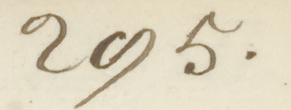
295.
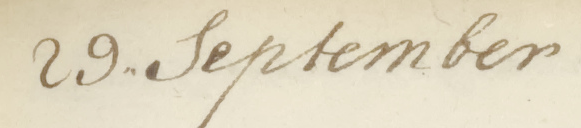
29. September
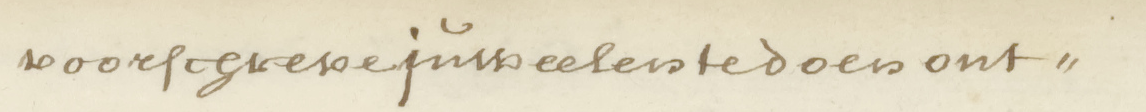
voorschreve juweelen te doen ont„
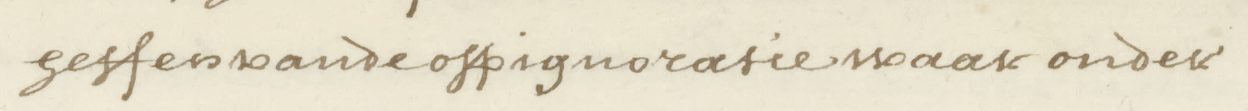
heffen vande oppignoratie waar onder
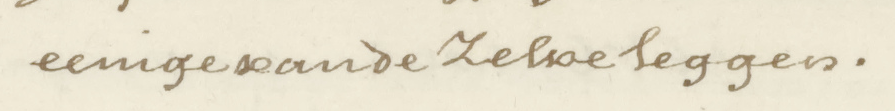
eenige vandezelve leggen.
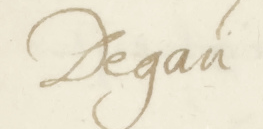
Degau
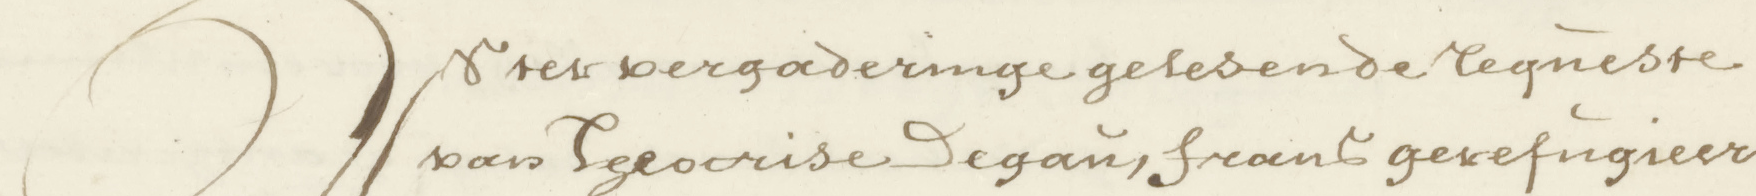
Is ter vergaderinge gelesen de requeste
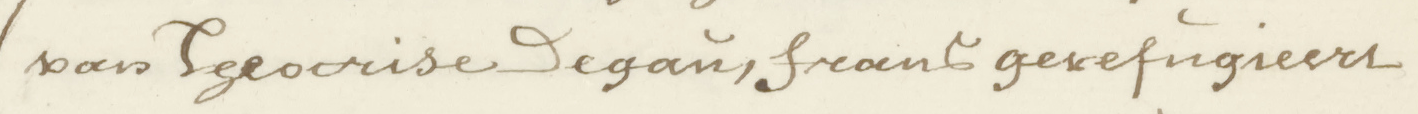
van Theocrise Degau, Frans gerefugieert
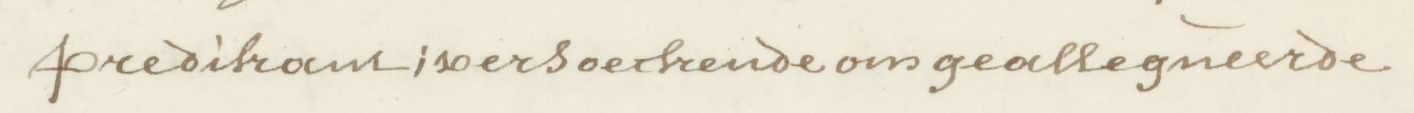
predikant, versoeckende om geallegueerde
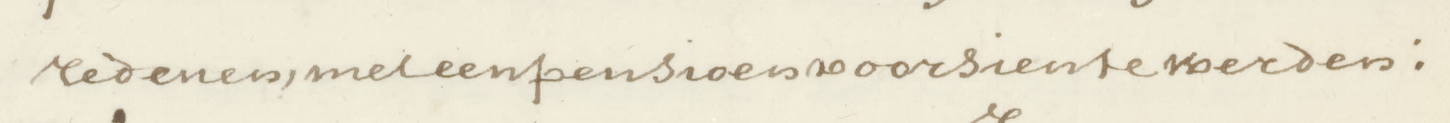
redenen, met een pensioen voorsien te werden:
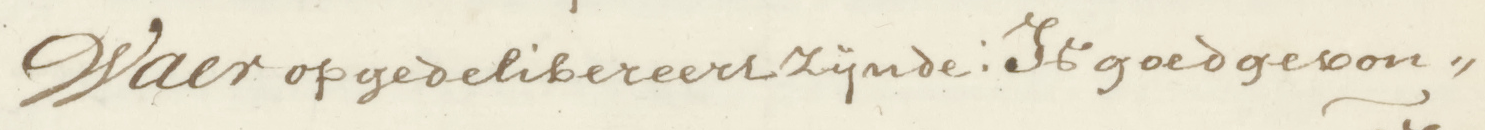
Waer op gedelibereert zijnde, Is goedgevon„
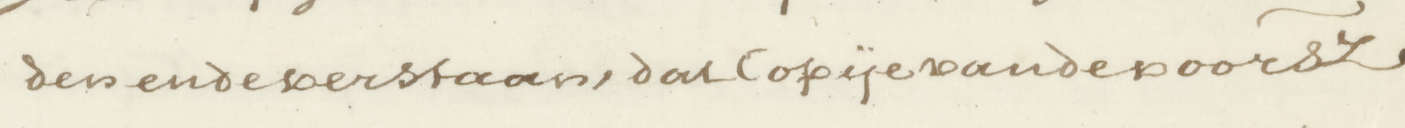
den ende verstaan dat copije vande voorsz
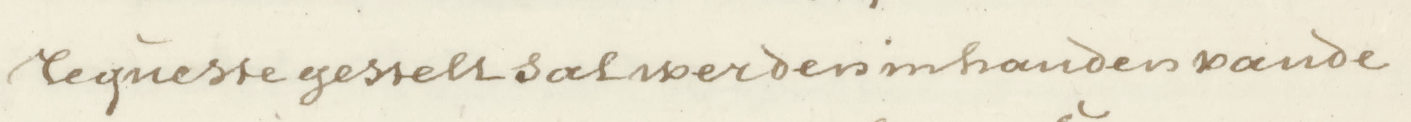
requeste gestelt sal werden in handen vande
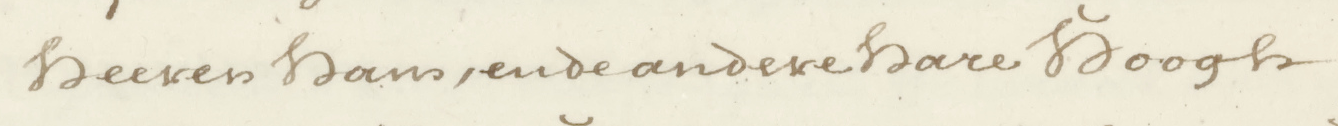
Heeren Ham, ende andere hare Hoogh
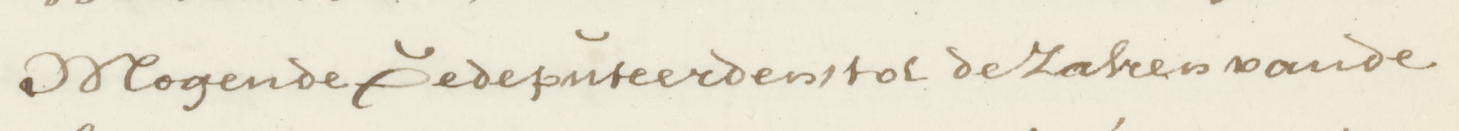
Mogende Gedeputeerden, tot de zaken vande
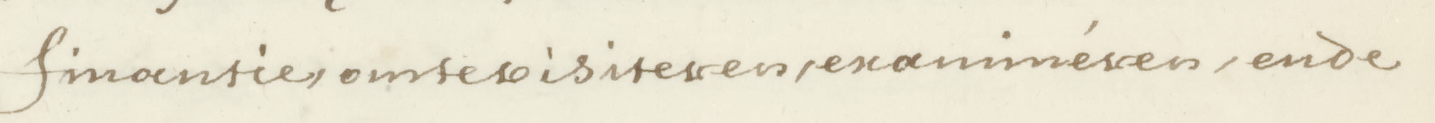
finantie, om te visiteren, examineren, ende
